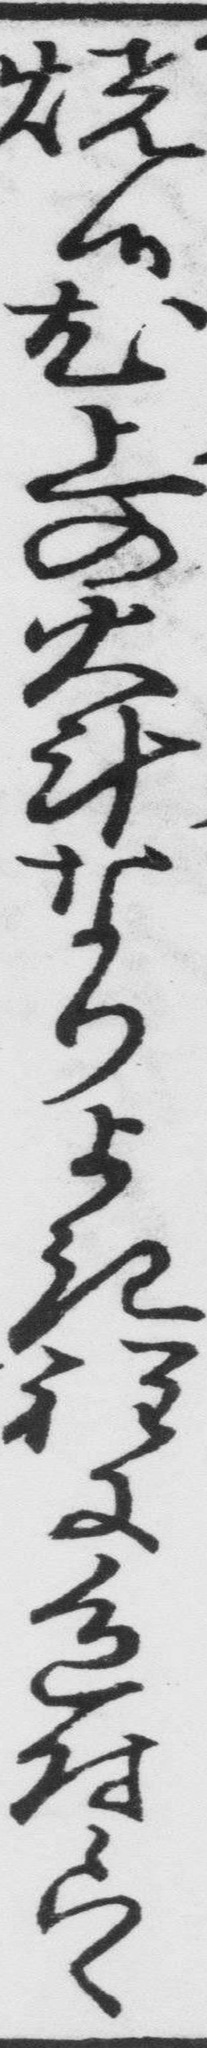焼候尤上の火斗なりよき程に色付候はゝ
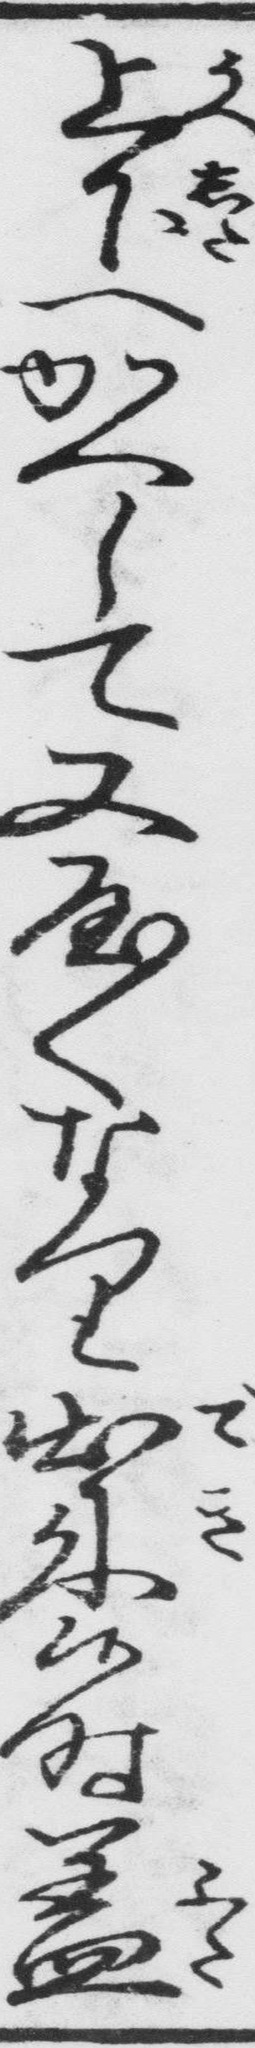上下へかへして又やくなり出来候時蓋
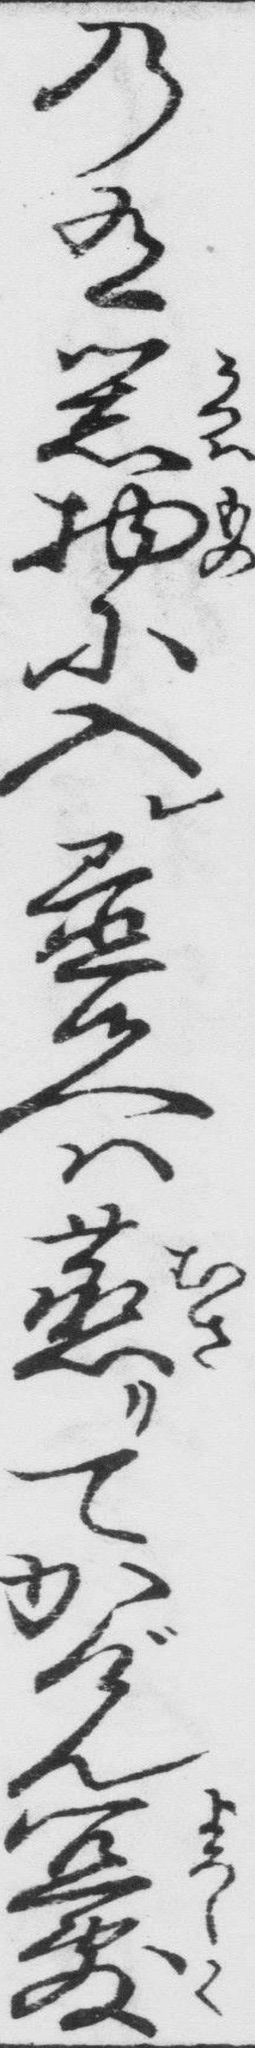の有器物に入レ置候へは蒸りてかげん宜敷
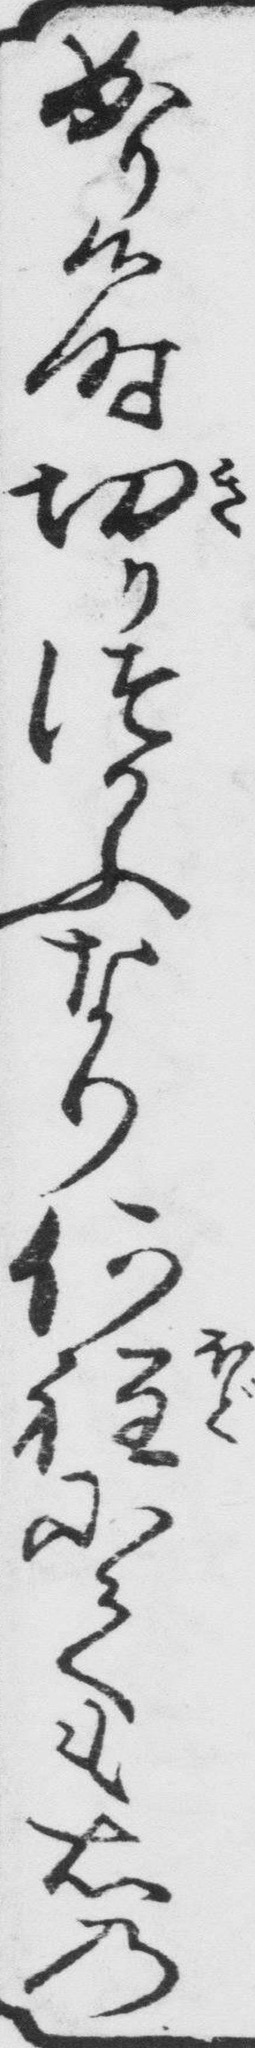成り候時切りつかふなり何程にても右の
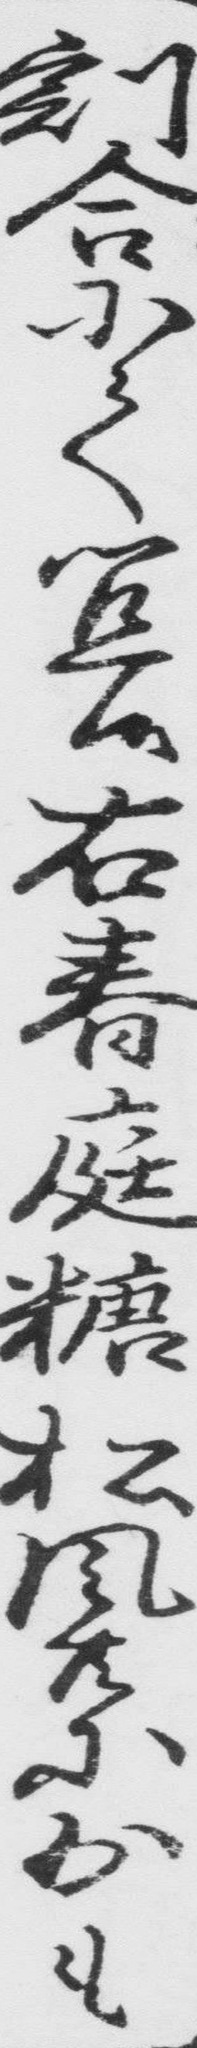割合にて宜候右春庭糖松風共に少も
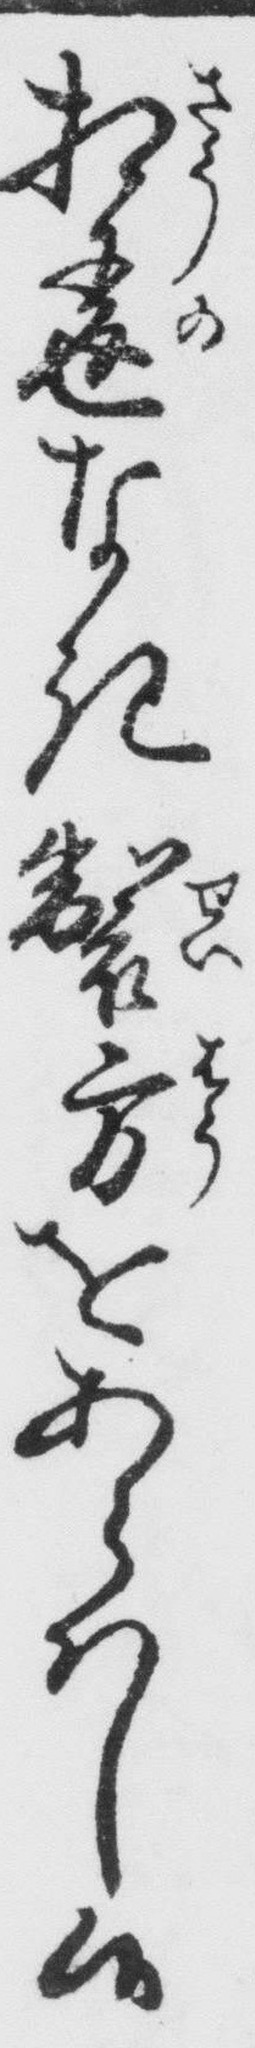相違なき製方をあらはし候
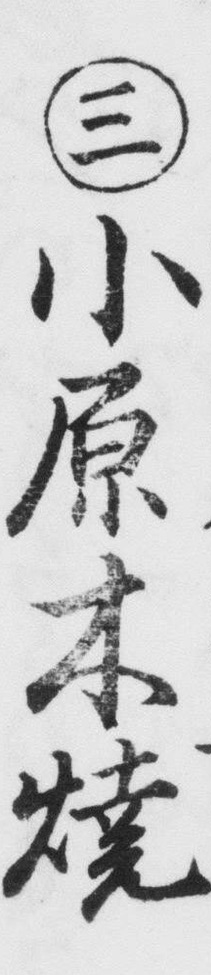(三)小原木焼
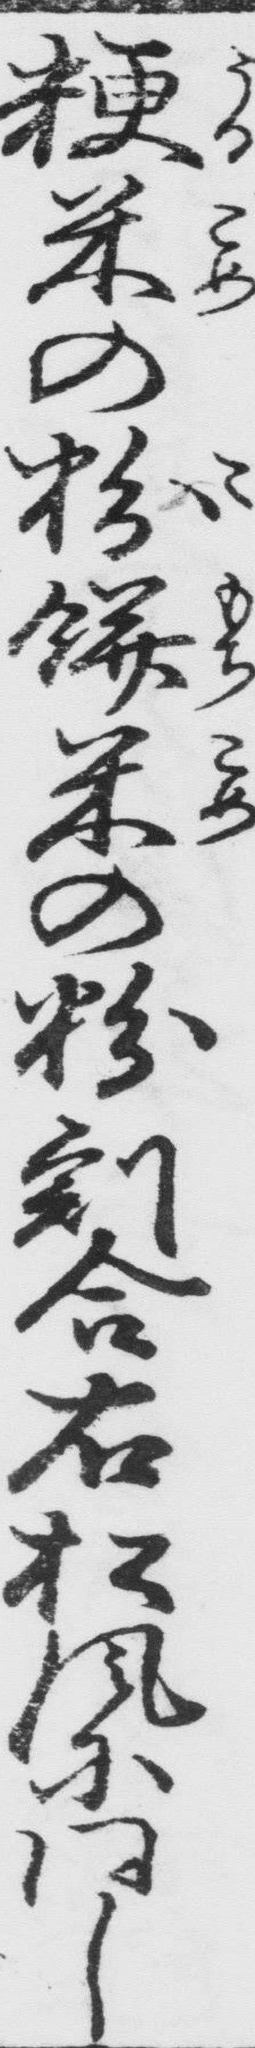粳米の粉餅米の粉割合右松風に同し
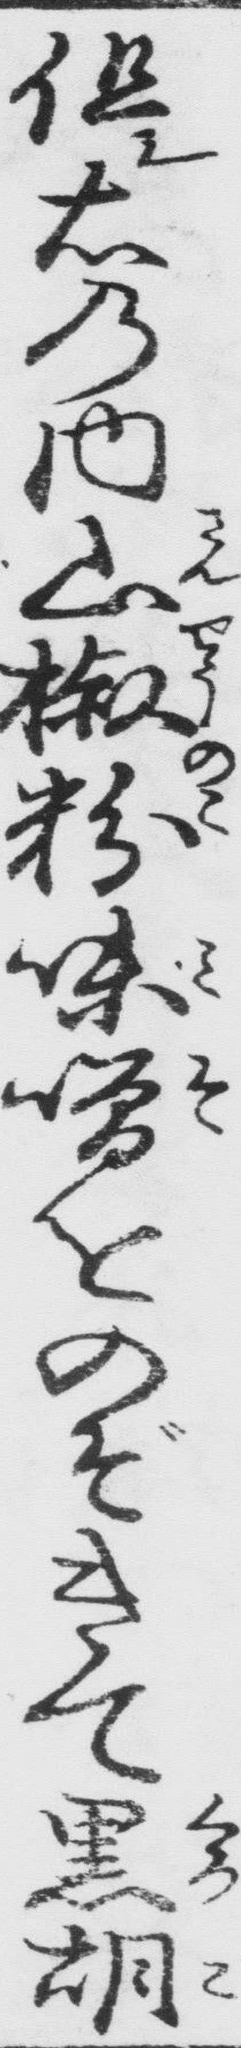但し右の内山椒粉味噌をのぞきて黒胡
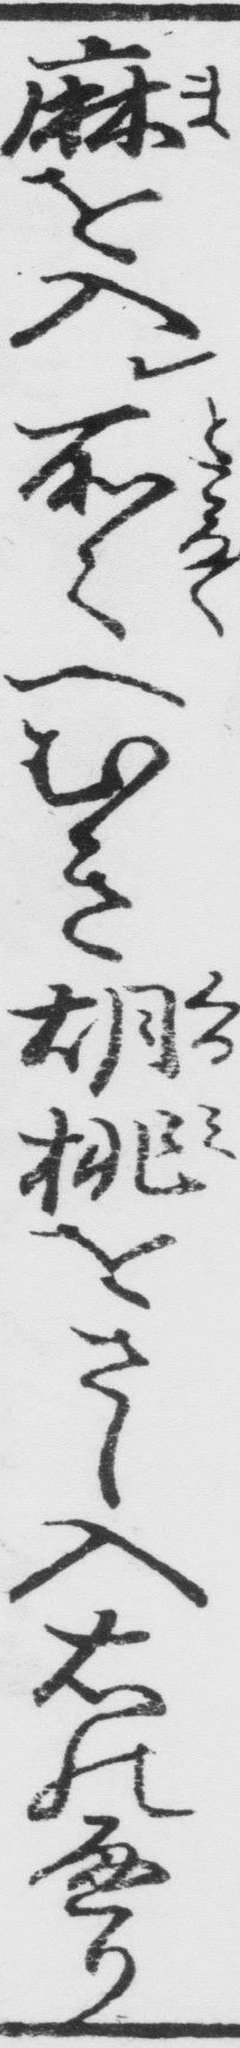麻を入れ所々へむき胡桃をさし入右の通り

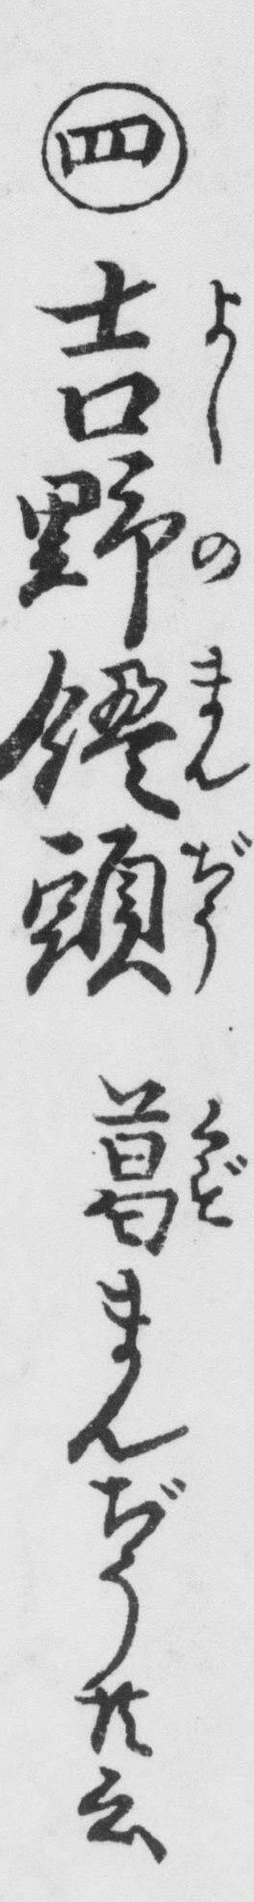(四)吉野饅頭葛まんぢう共云
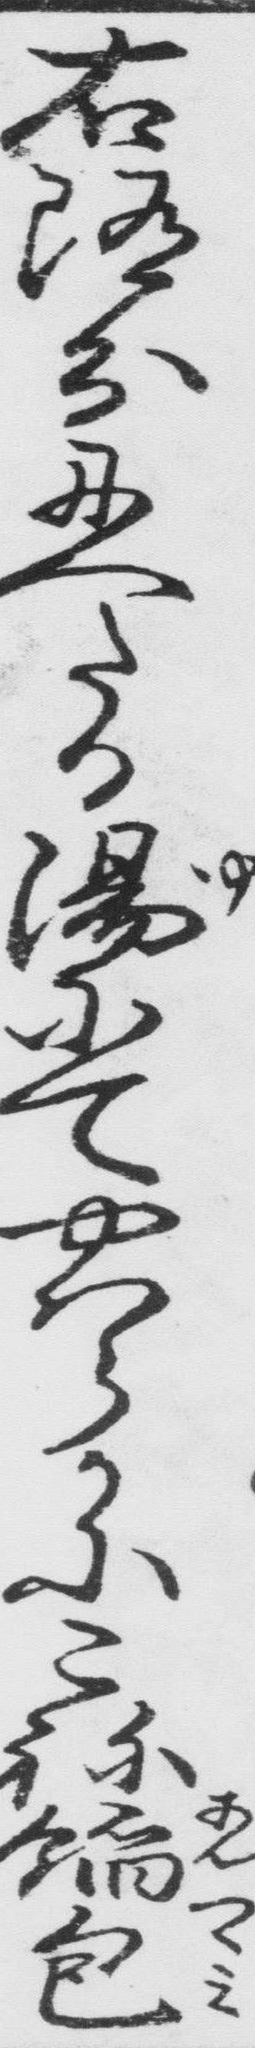右随分にへたる湯にてやはらかにこね餡包
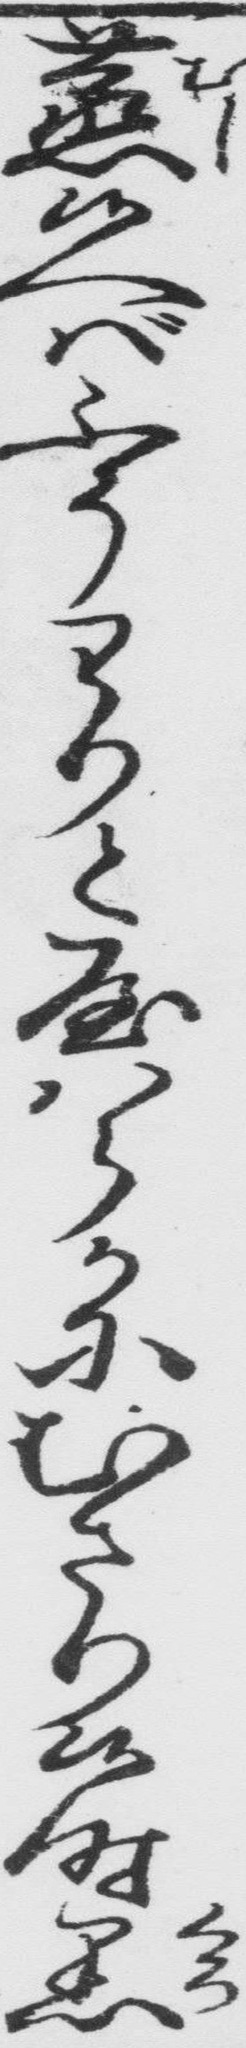蒸候へばふうわりとやはらかにむさり候時黒
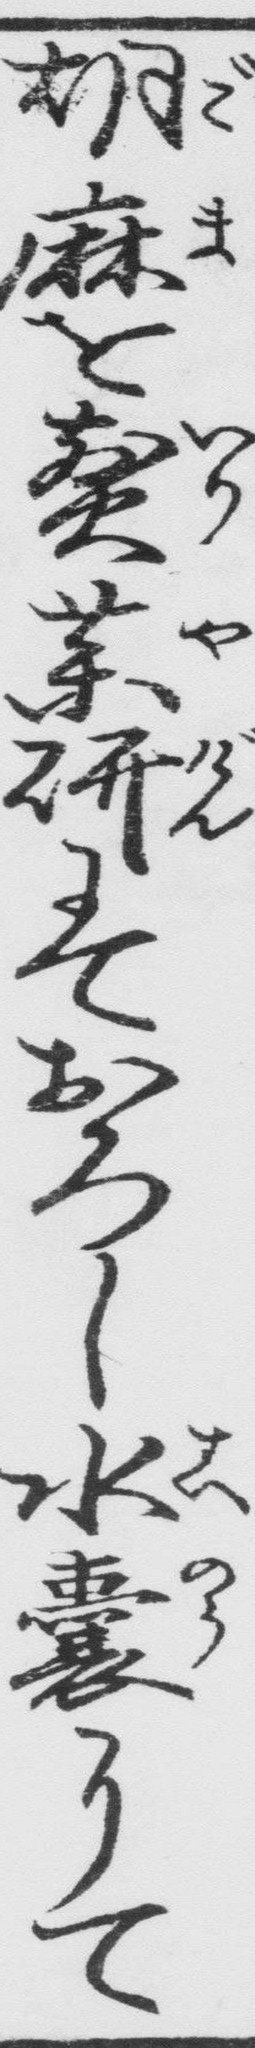胡麻を煎薬研にておろし水嚢にて
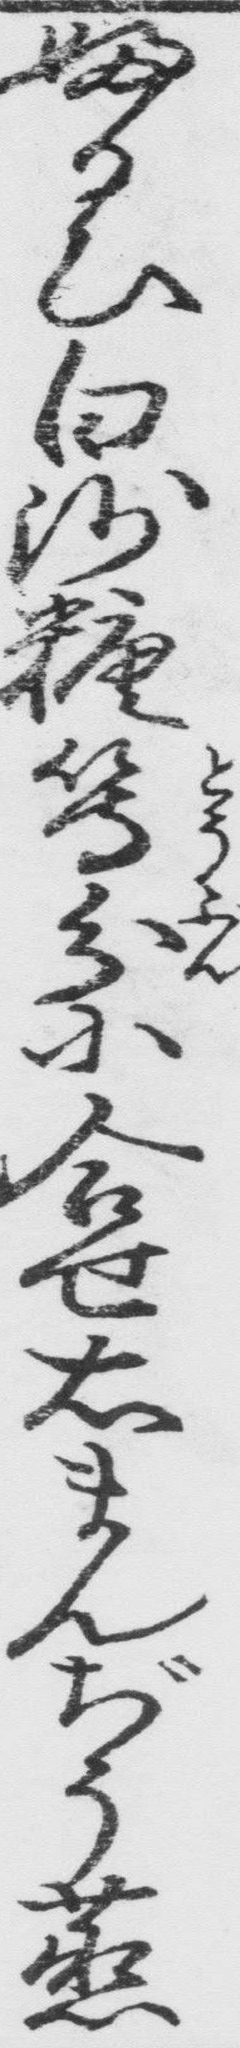ふるひ白沙糖等分に合せ右まんぢう蒸
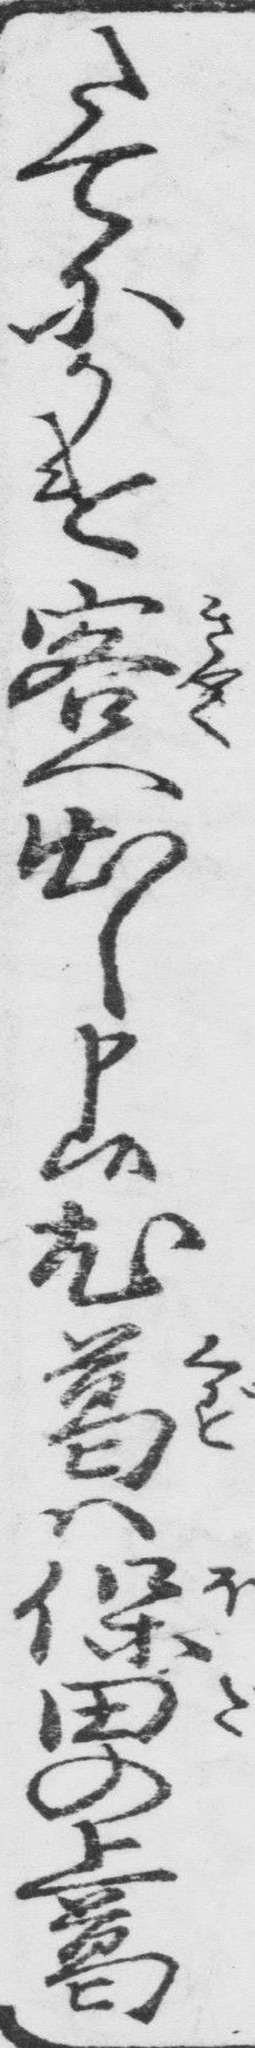たてにかけ客へ出し申候尤葛は保田の上葛
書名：御前菓子図式
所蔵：大阪府立大学学術情報センター 国文学研究資料館
